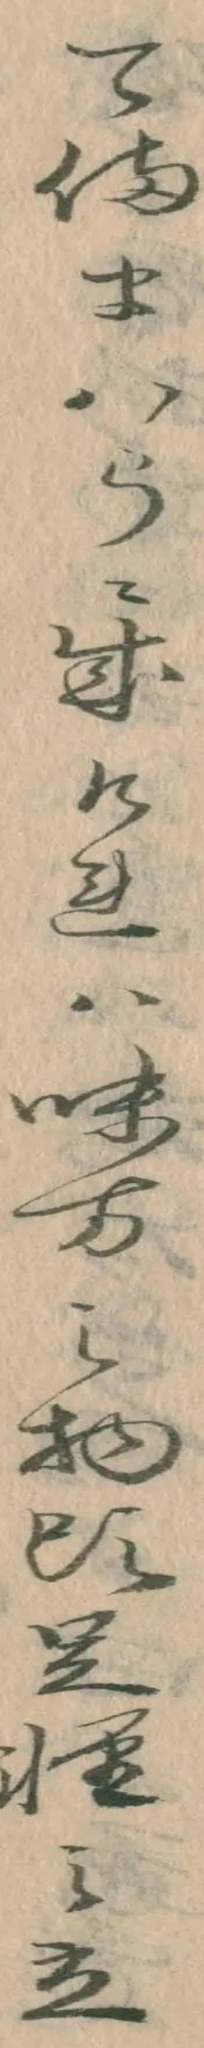て備まはらに成け連は味方之物頭足軽之立
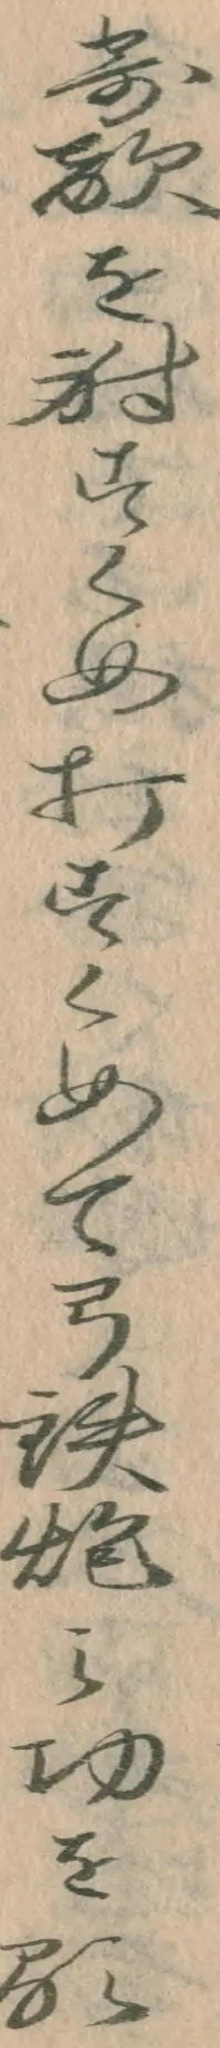寄敵を射春くめ打春くめて弓鉄炮之功を顕
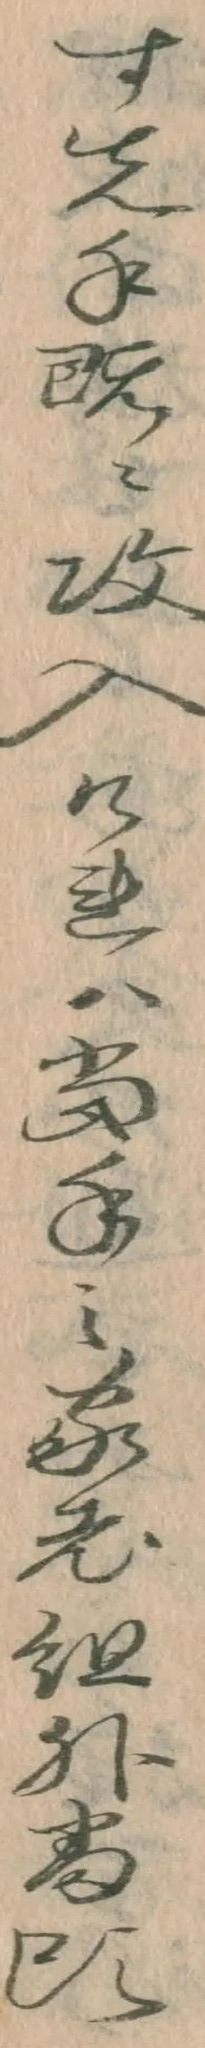す先手既に攻入け連は当手之家老組外番頭
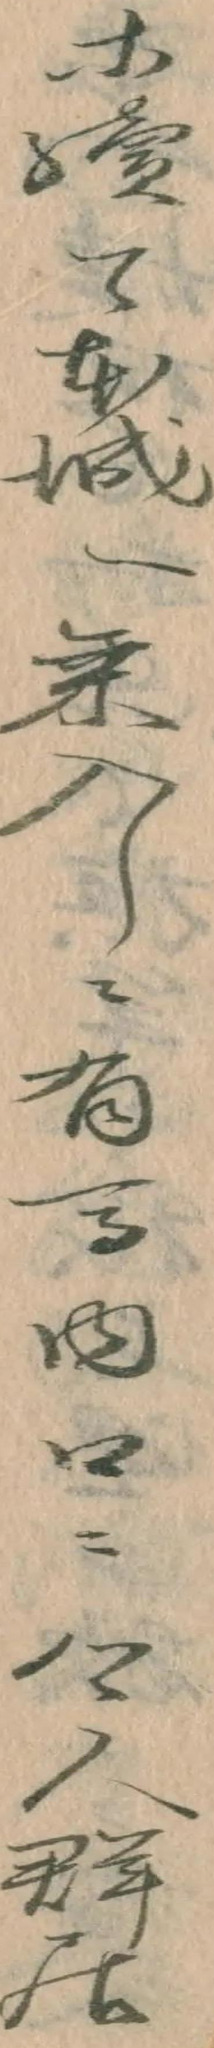等続て本城へ乗入しに有馬内口に郷人群居
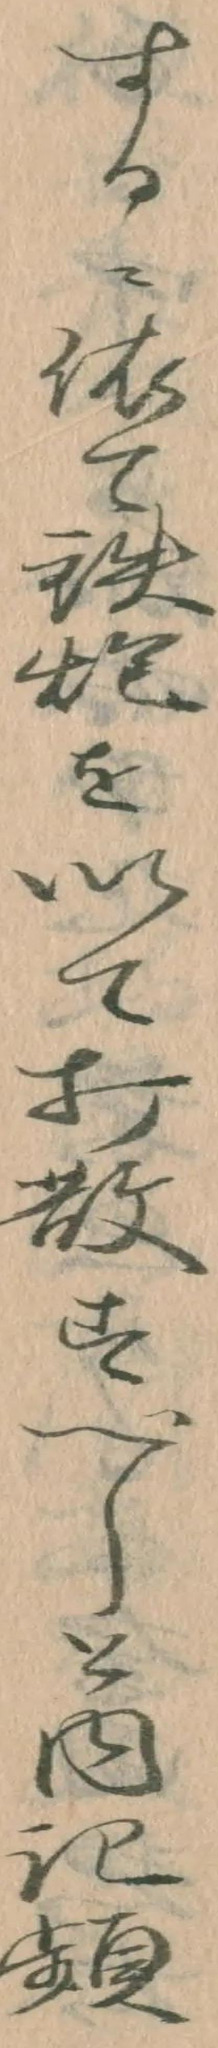するに依て鉄砲を以て打散春へしと内記頻
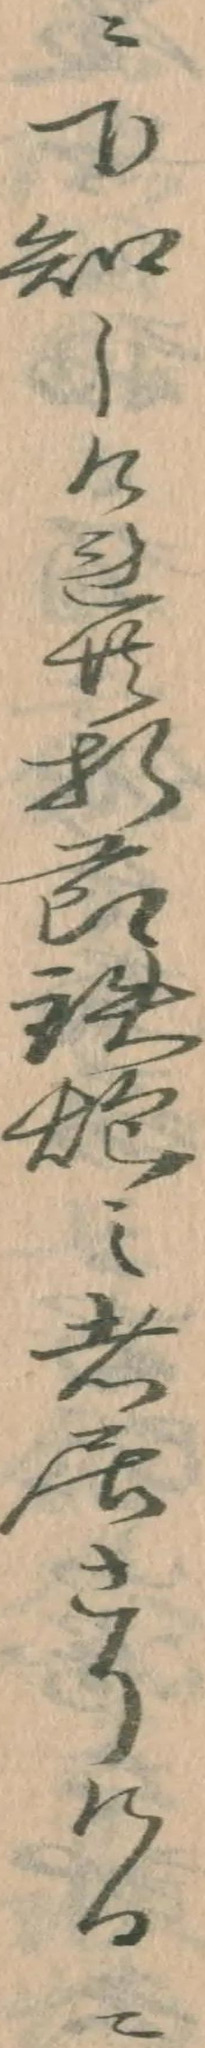に下知しけ連共折節鉄砲之者居さりけるに
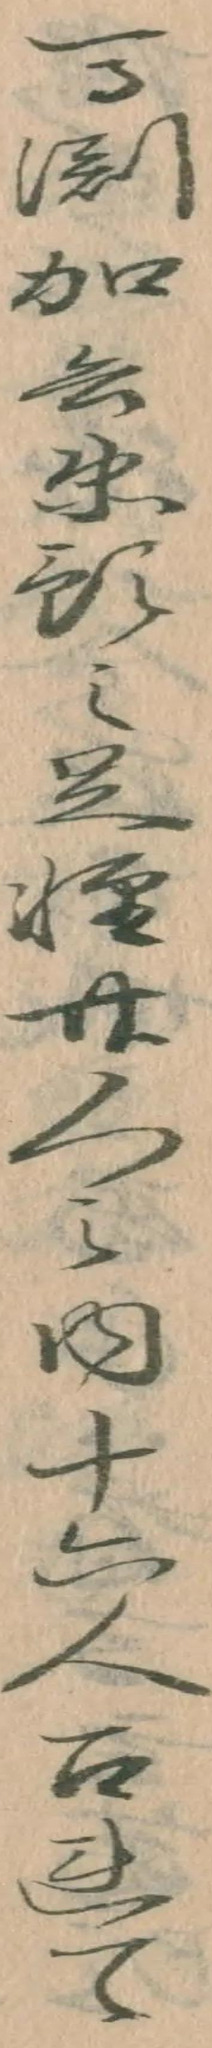馬渕加兵衛預之足軽廿人之内十六人召連て
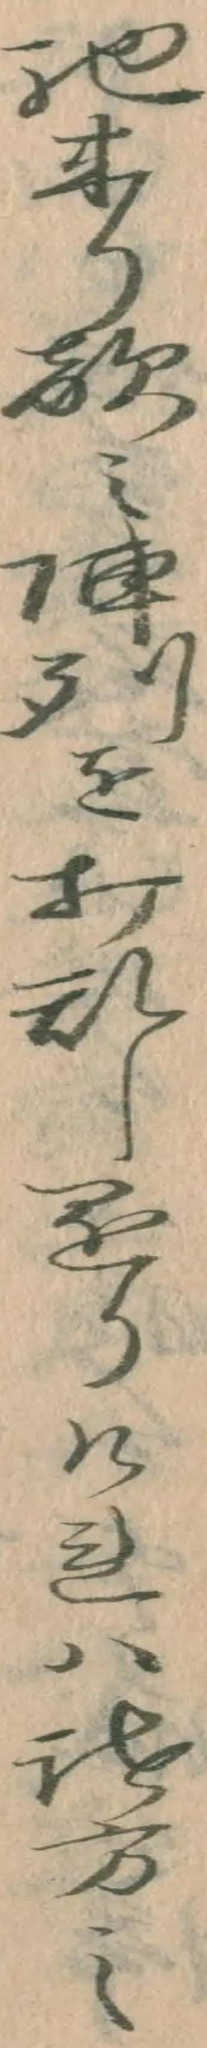馳来り敵之陣列を打乱し懸りけ連は諸方之
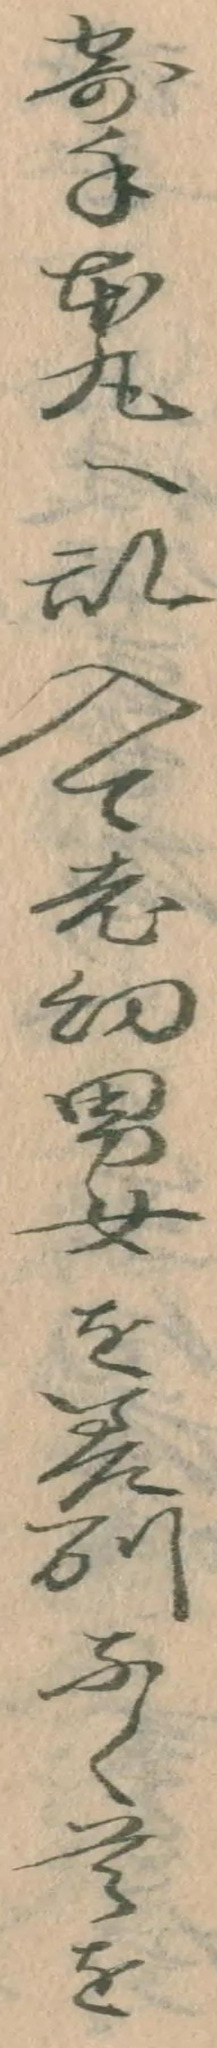寄手本丸へ乱入て老幼男女を差別なく首を
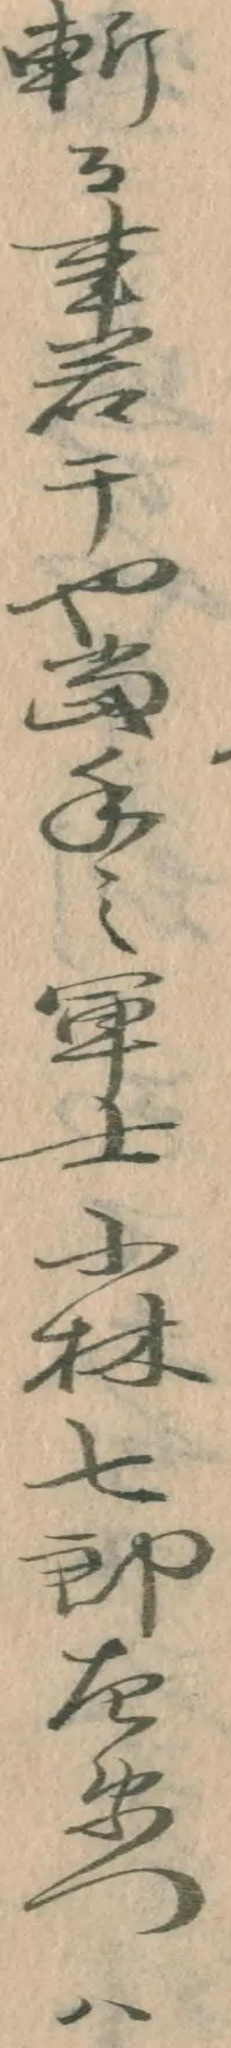斬る事若干也当手之軍士小林七郎左衛門は
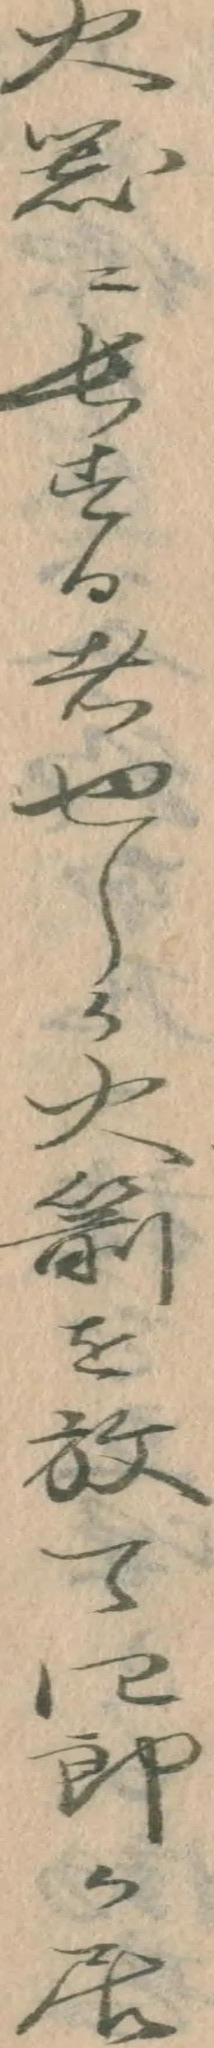火箸に長春る者也しか火箭を放て四郎か居
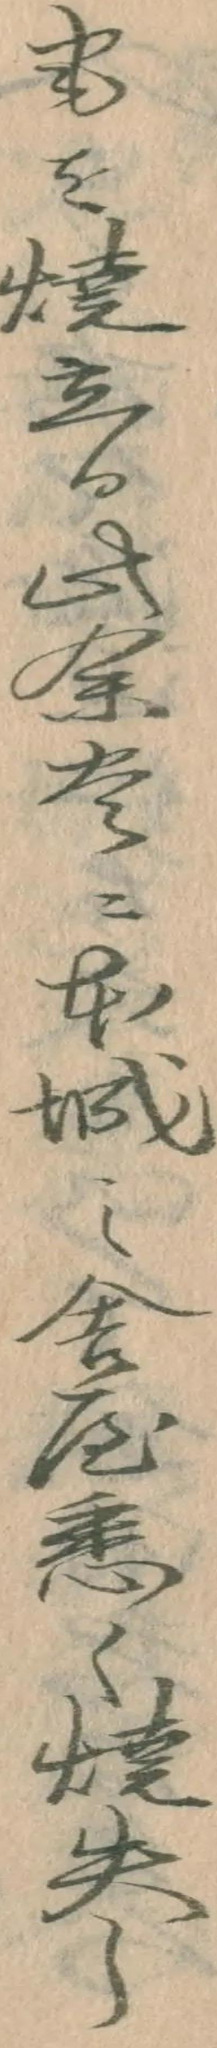宅を焼立る此余炎に本城之舎屋悉く焼失し
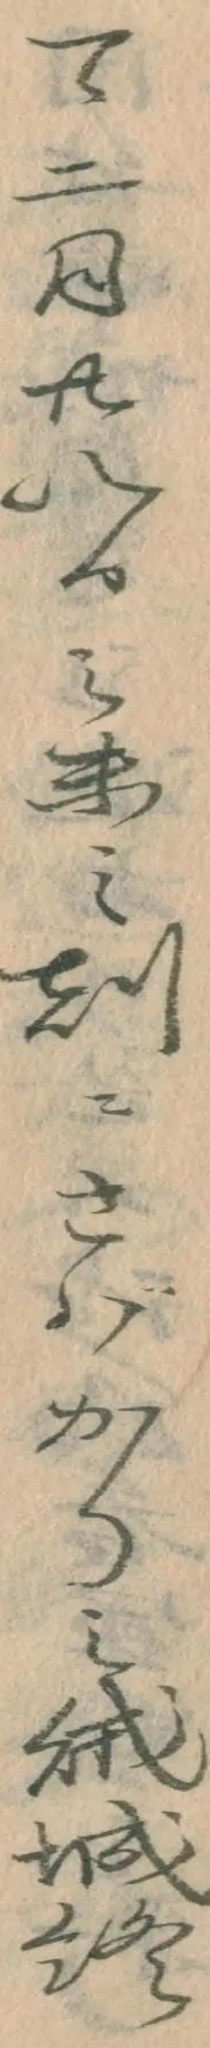て二月廿八日之未之刻にさはかり之族城終
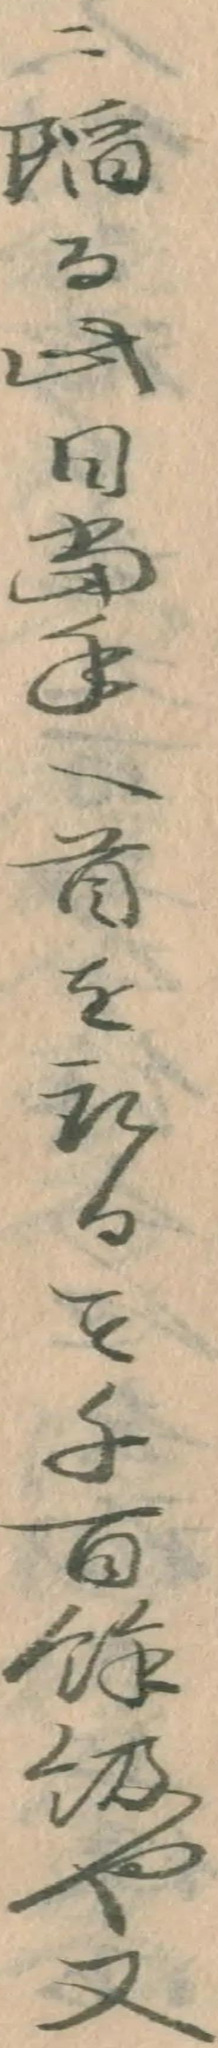に陥る此日当手へ首を取る亊千百余組也又
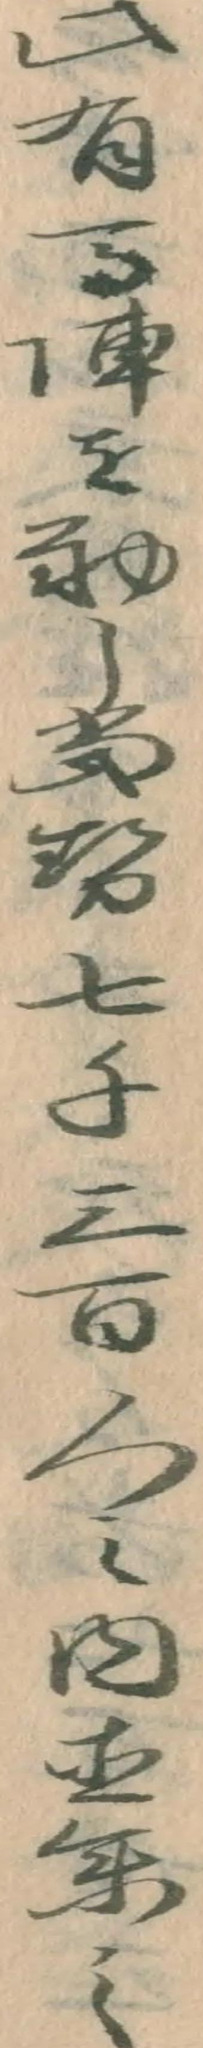此有馬陣を勤し当勢七千三百人之内直参之

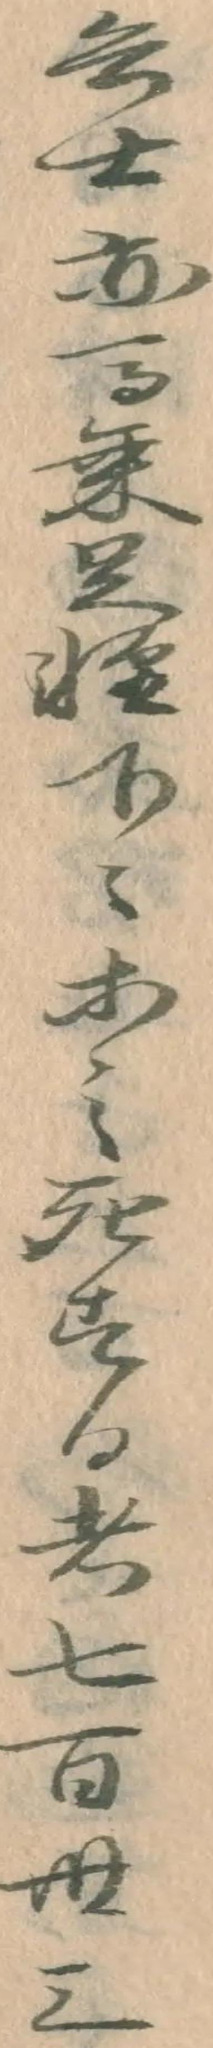兵士亦馬乗足軽下々等之死春る者七百丗三
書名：切支丹御退治記 49巻. [9]
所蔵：国立国会図書館 National Diet Library, JAPAN
